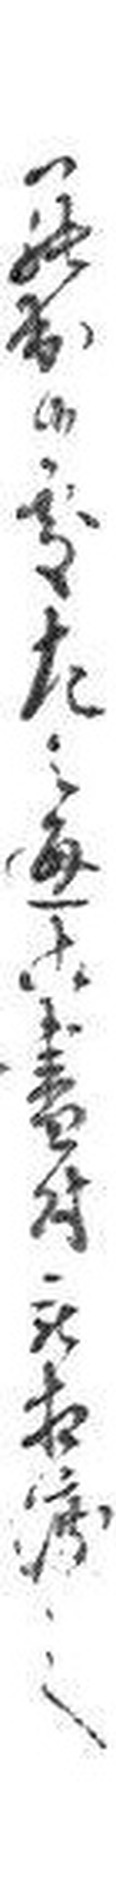罷出候処左之通御書付被相渡之
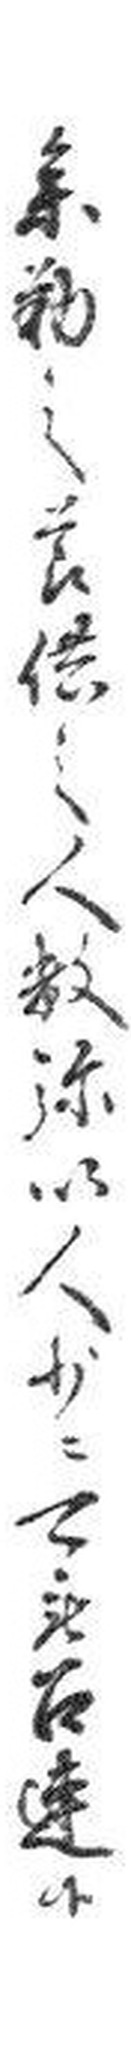参勤之節供之人数弥以人少ニ可被召連候
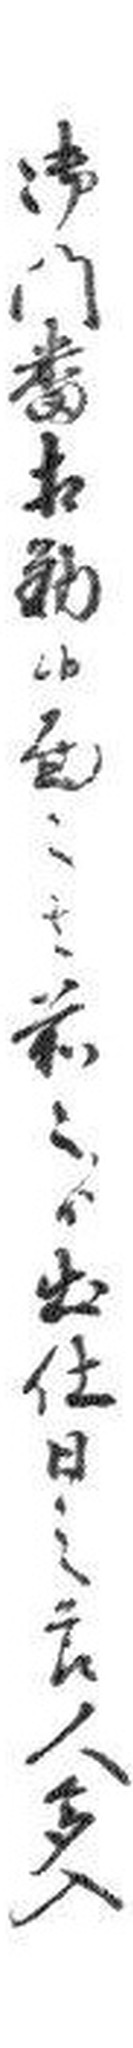御門番相勤候面々者前々ゟ出仕日之節人多入
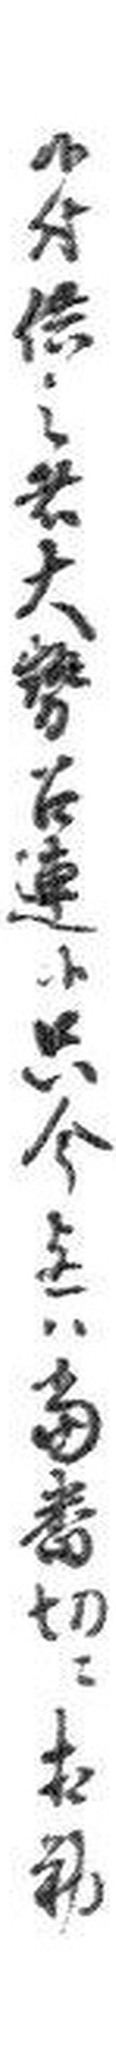候付供之者大勢召連候只今迄ハ当番切ニ相勤
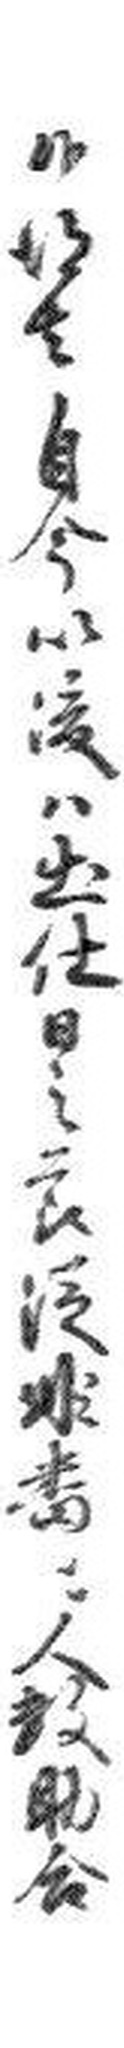候得者自今以後ハ出仕日之節従非番と人数助合
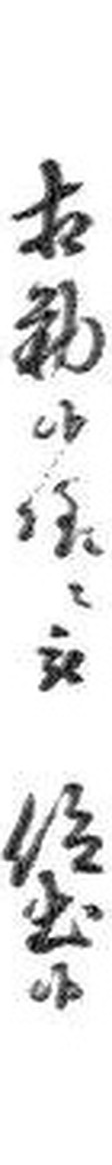相勤候様ニ被仰出候
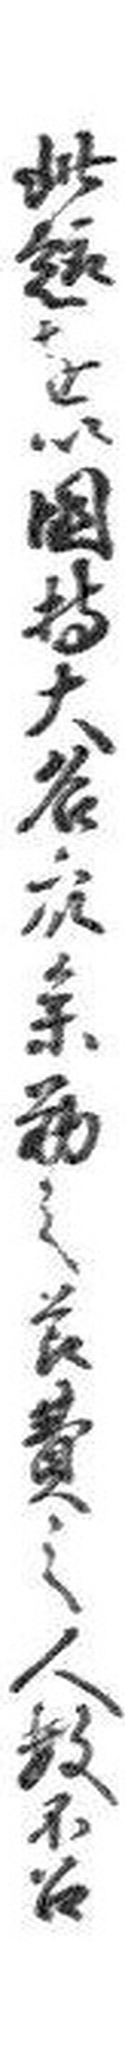此趣を以国持大名衆参勤之節費之人数不召
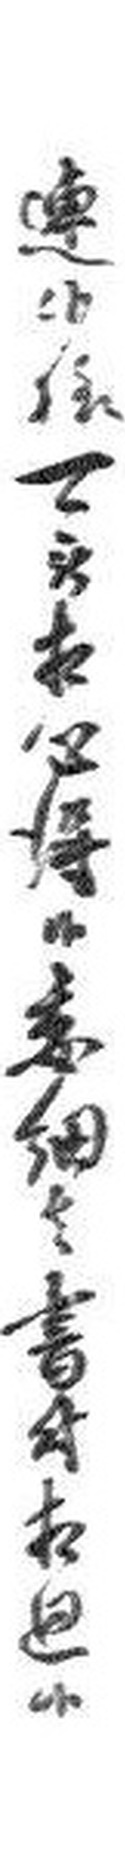連候様可被相心得候委細者書付相廻候
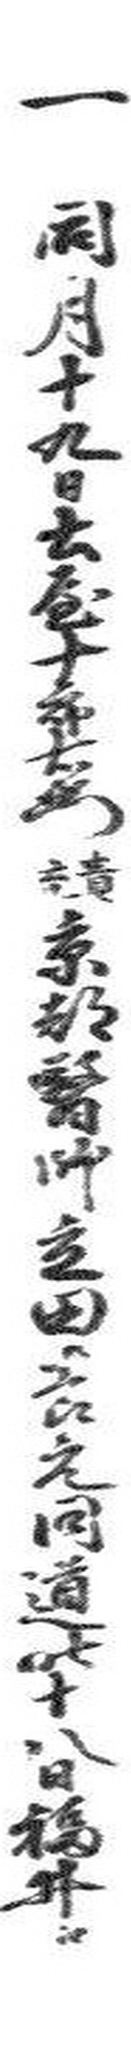一同月十九日土屋十郎右衛門貴充京都医師立田養元同道昨十八日
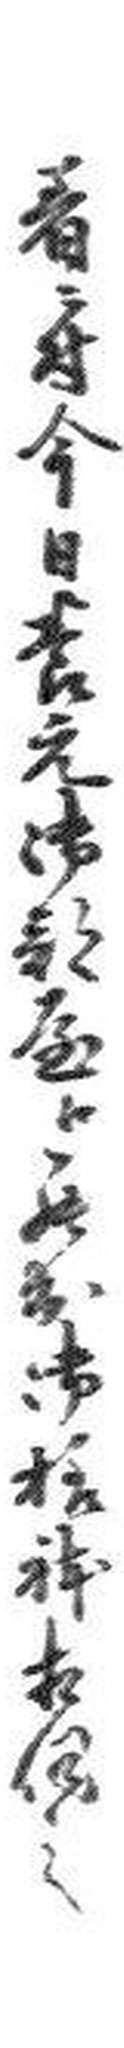着ニ付今日養元御部屋江罷出御様体相伺之
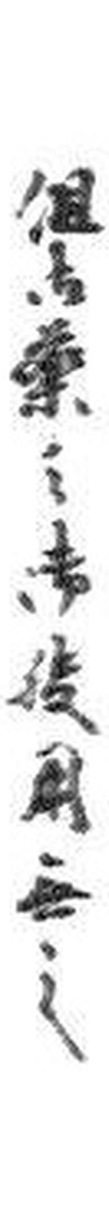但御薬之御服用無之
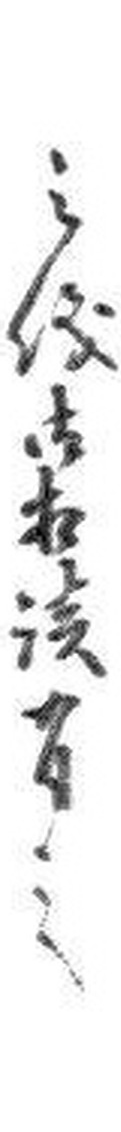之儀御相談有之

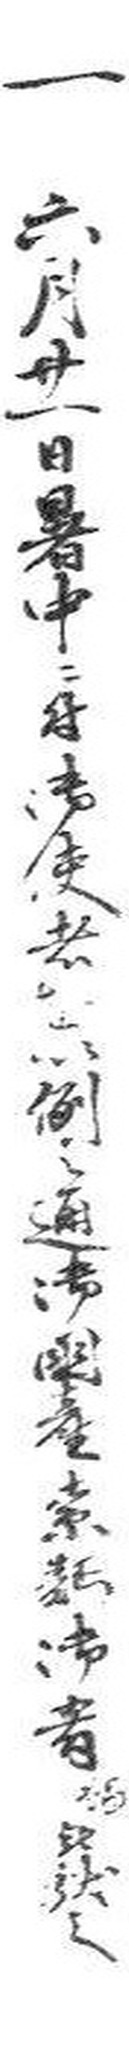一六月廿一日暑中ニ付御使者を以例之通御国産索麵御肴被献之
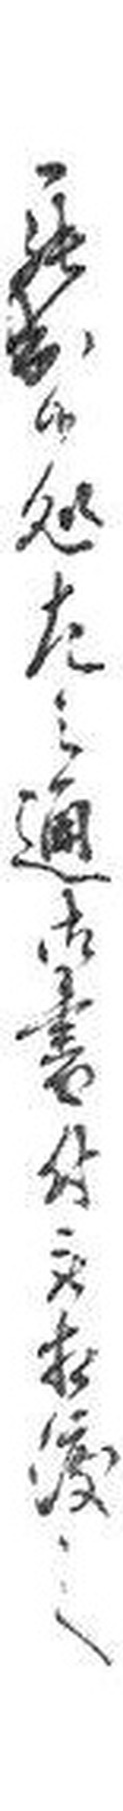罷出候処左之通御書付被相渡之
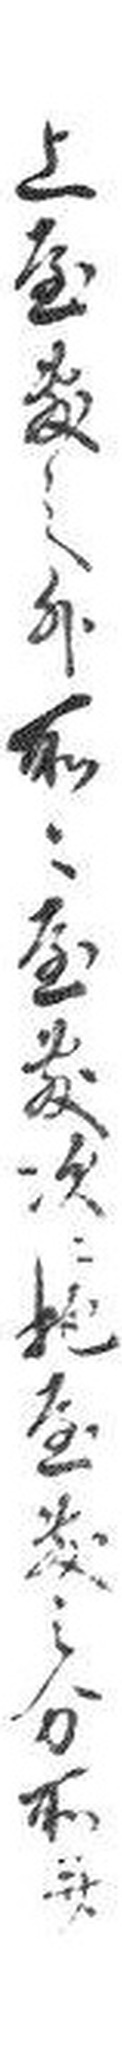上屋敷之外所々屋敷次ニ抱屋敷之分所并
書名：家譜 二十九 吉邦公 従正徳二年到正徳三年
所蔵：福井県文書館 Fukui Prefectural Archives
